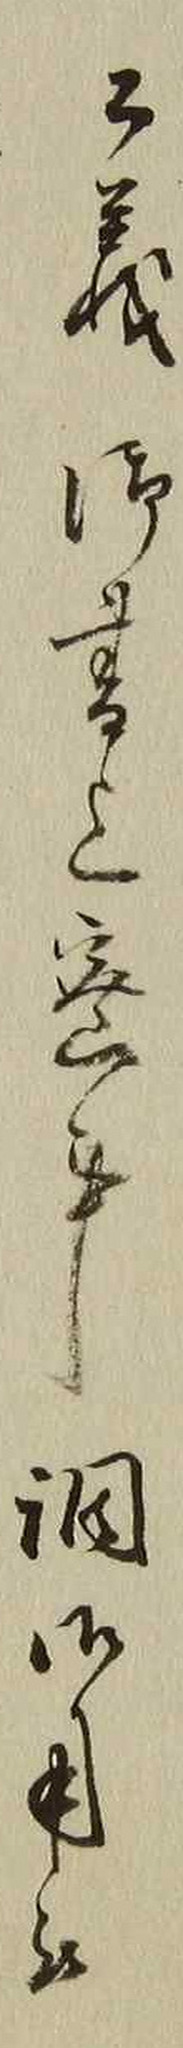公義御書上密事調御用被
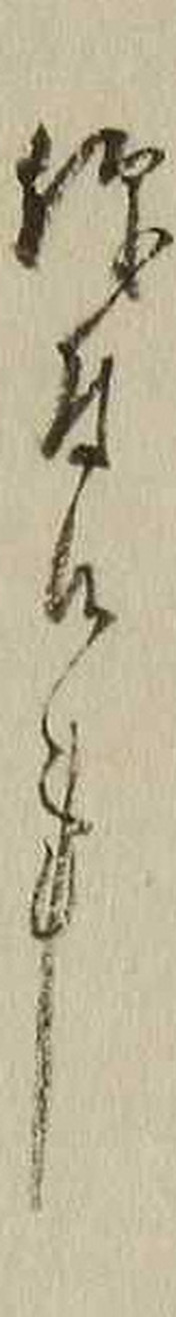仰付候事
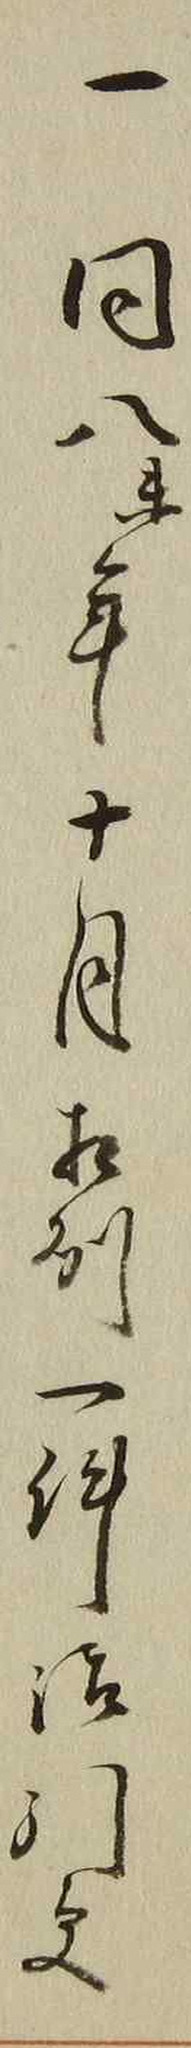一同八未十月相州一件御引受
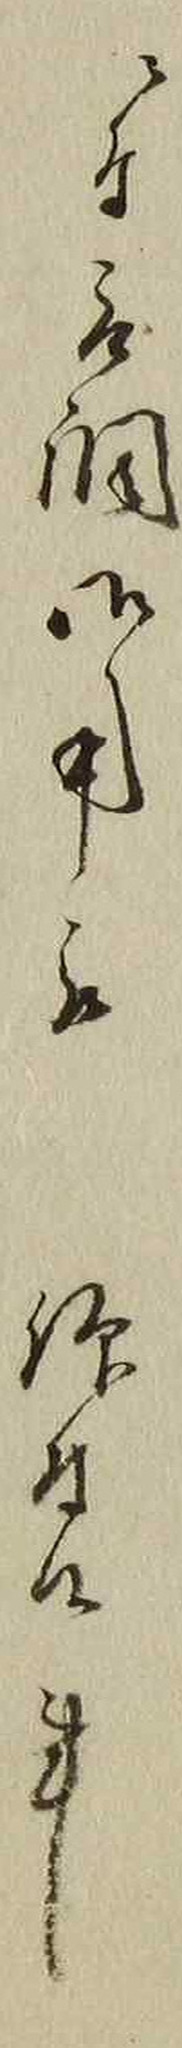ニ付取調御用被仰付候事
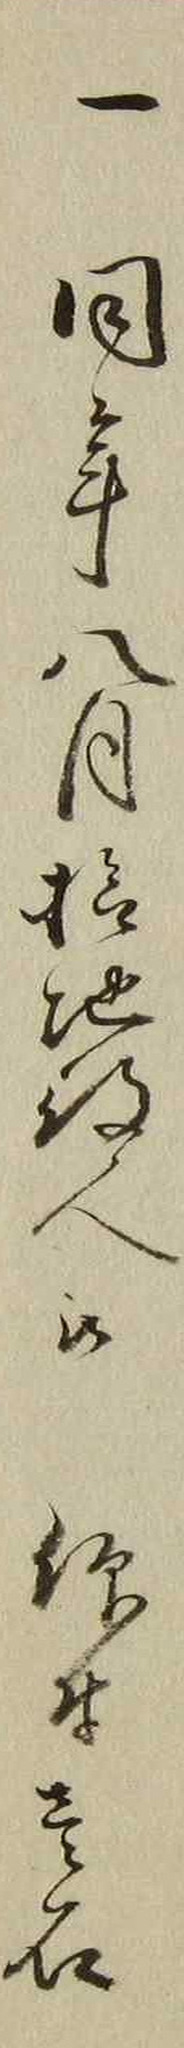一同年八月検地役人被仰付壱石
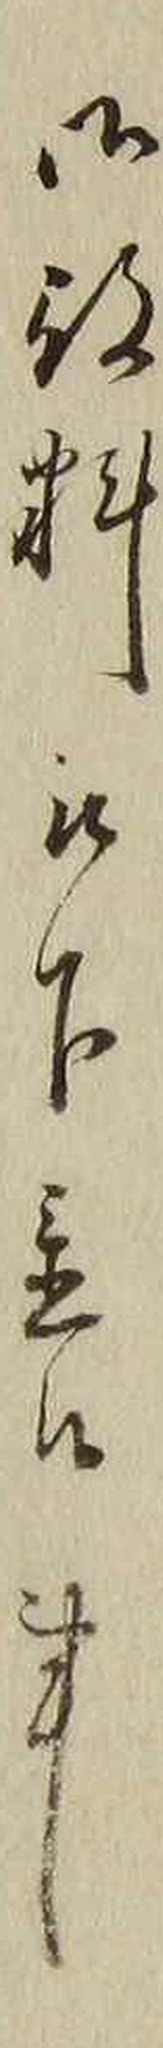御役被下置候事
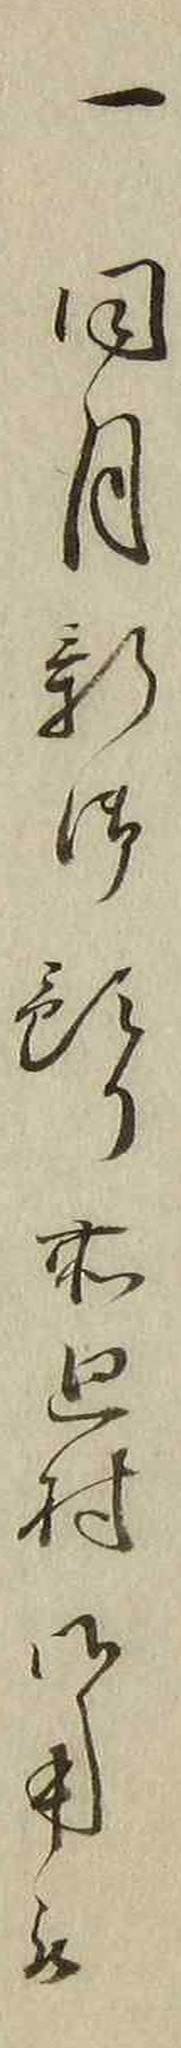一同月新御預り所廻村御用被
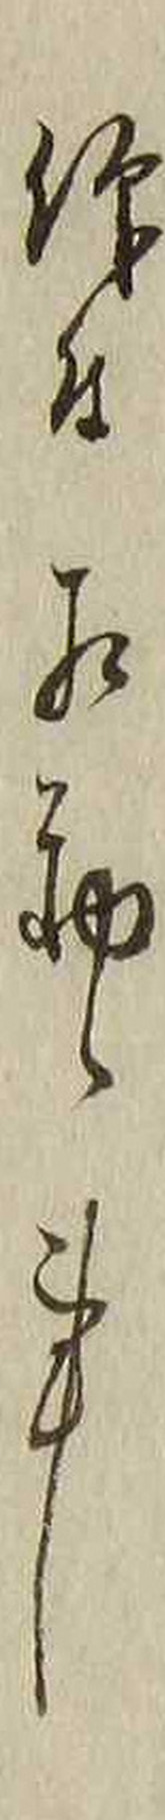仰付相勤候事
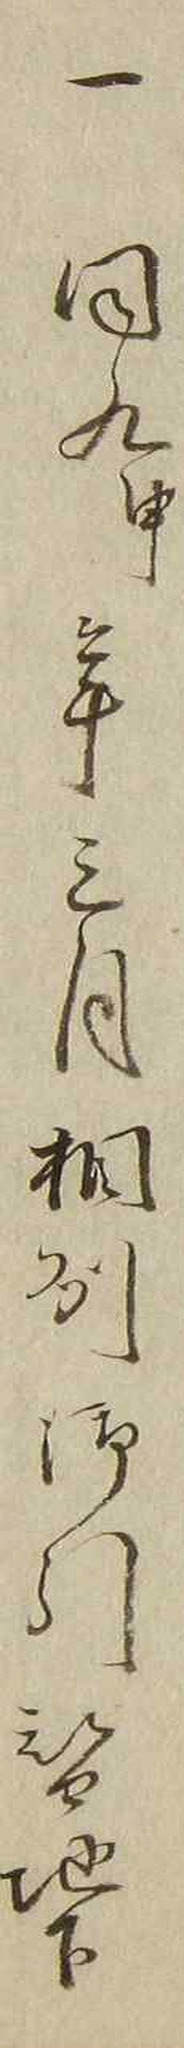一同九申年三月相州御引替地下

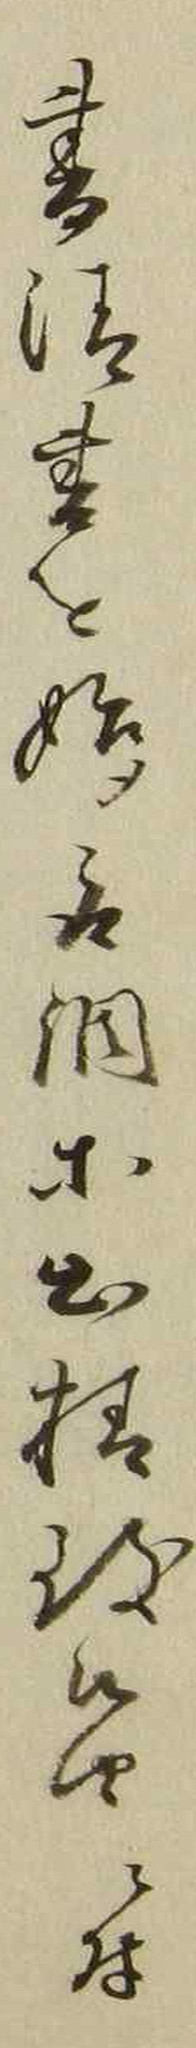書清書を始メ取調等出精致候由ニ付
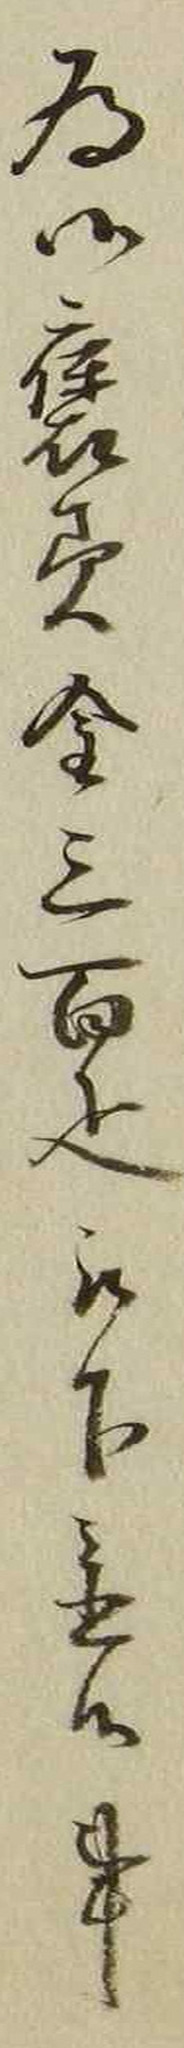為御褒美金三百疋被下置候事
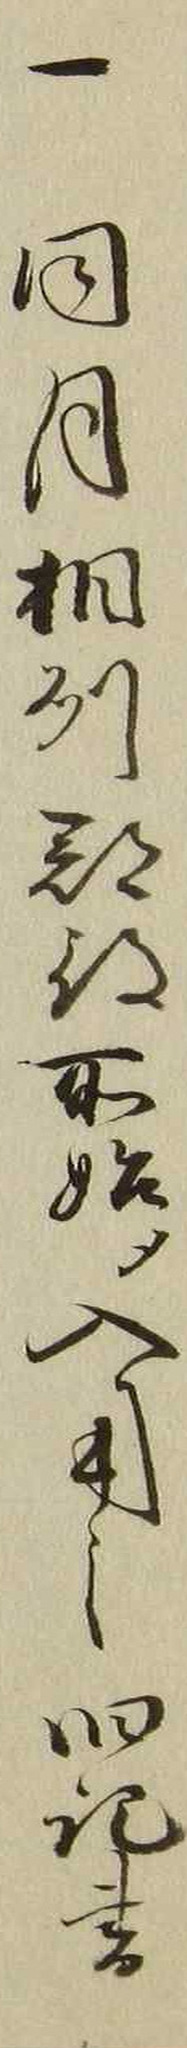一同月相州郡役所始メ入用之旧記書
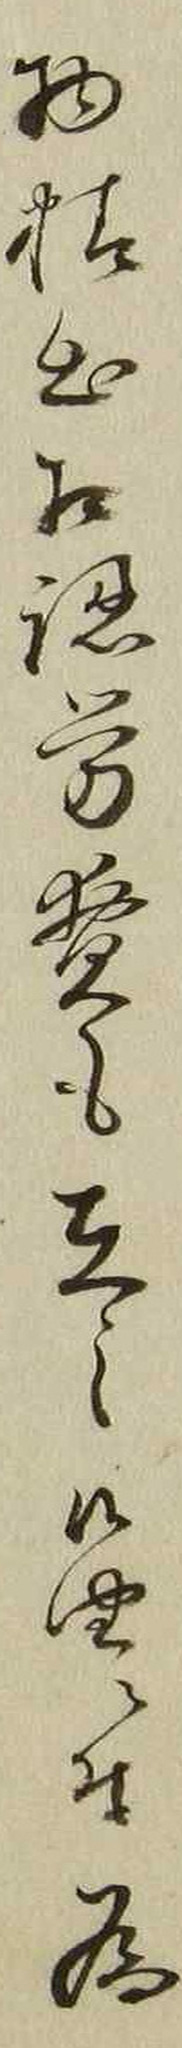物精出相認労費も在之候由ニ付為
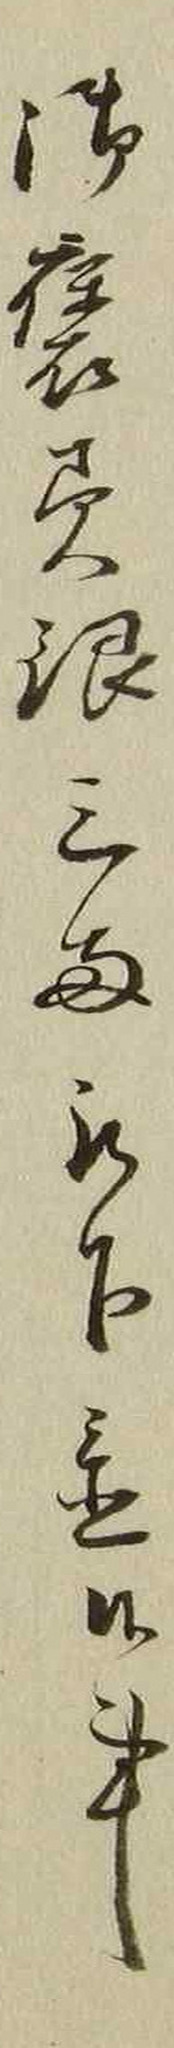御褒美銀三両被下置候事
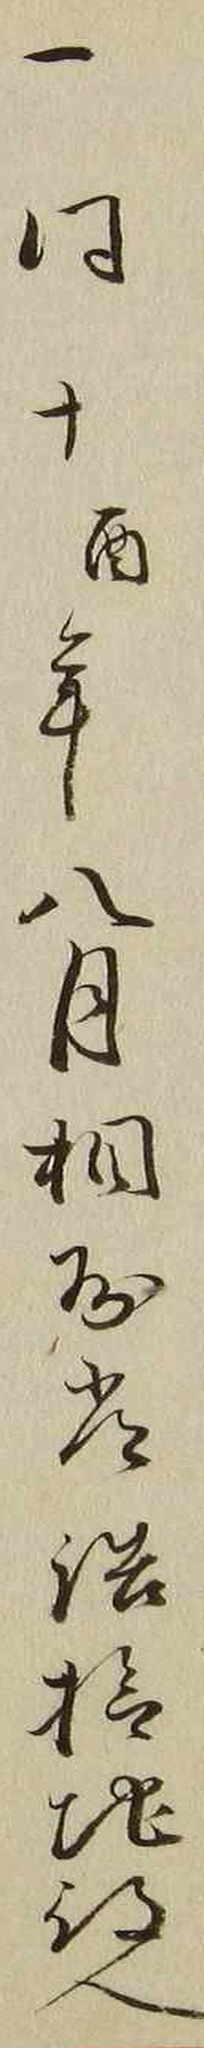一同十酉年八月相州常詰検地役人
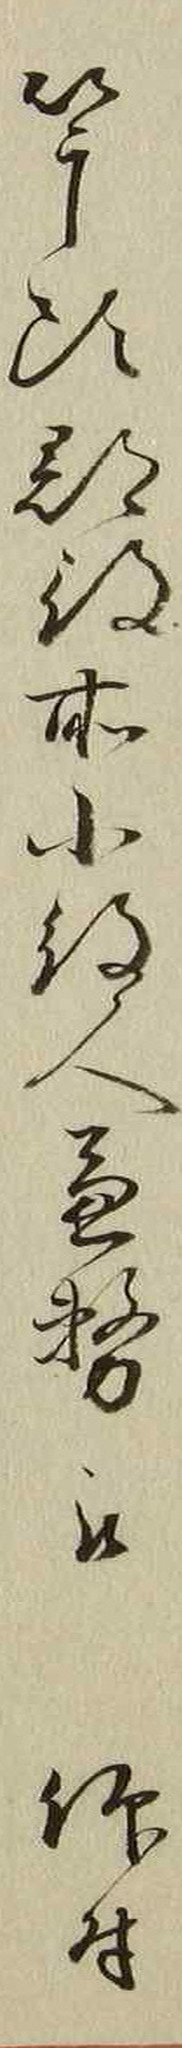竿頭郡役所小役人兼務被仰付
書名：諸士系譜　巻之32　い之部32
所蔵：会津若松市立会津図書館
